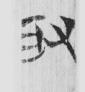取
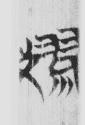{歹翏}
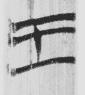王
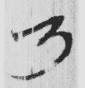乃
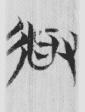{彳取}
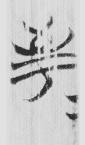{至于}=
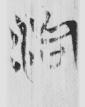泃
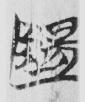{陽土}
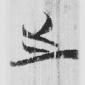之
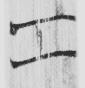工
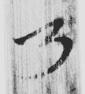乃
